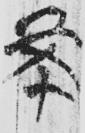不
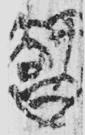智（知）
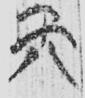亓（其）
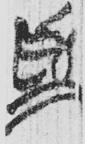爲
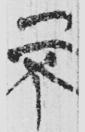不
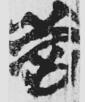善
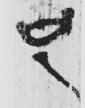也
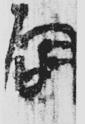含（今）
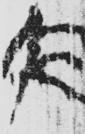內
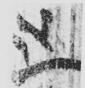之
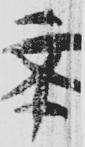不
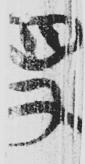○（得）
